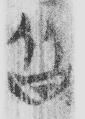皆
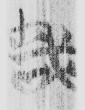哉
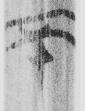不
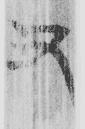又
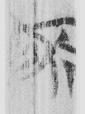所
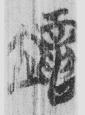{立竜}
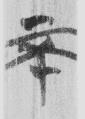不
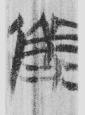備
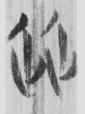{化化}
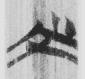文
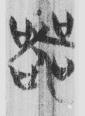器
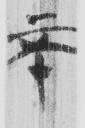不
